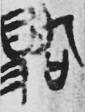○（鳩）
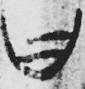曰
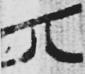亓（其）
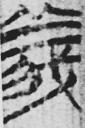義（儀）
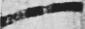一
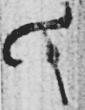氏（兮）
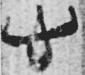心
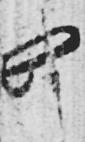女（如）
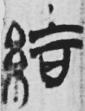結
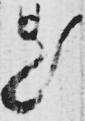也
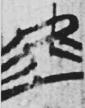○（吾）
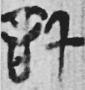○（信）
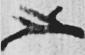之
